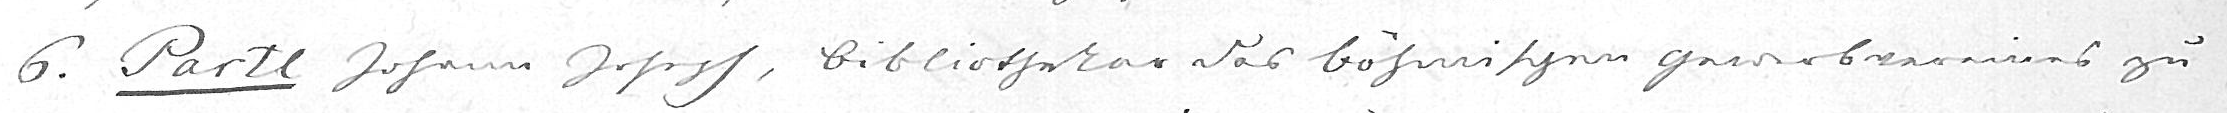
6. Partl Johann Joseph, Bibliothekar des böhmischen Gewerbevereines zu
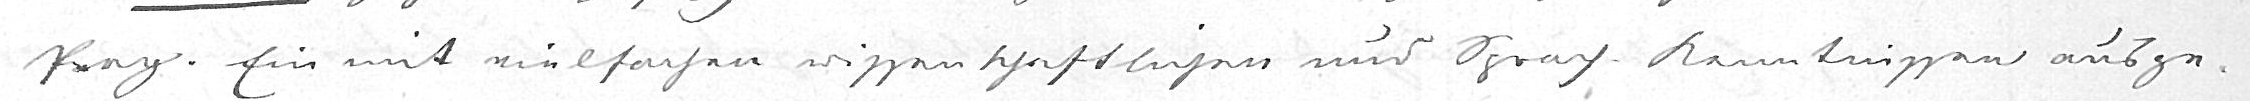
Prag. Ein mit vielfachen wissenschaftlichen und Sprach Kenntnissen ausge-
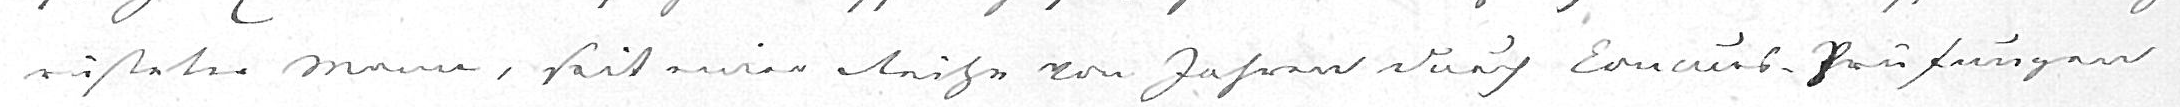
richteter Mann, seit einer Reihe von Jahren durch Concurs-Prüfungen
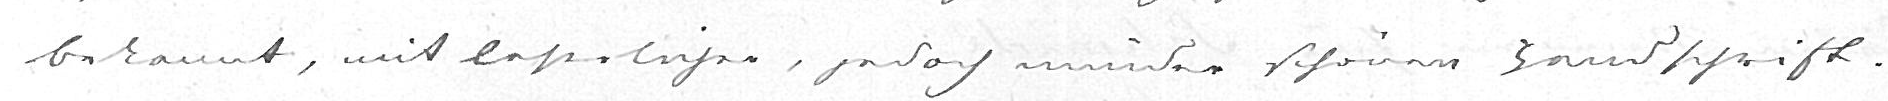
bekannt, mit leserlicher, jedoch minder schönen Handschrift.
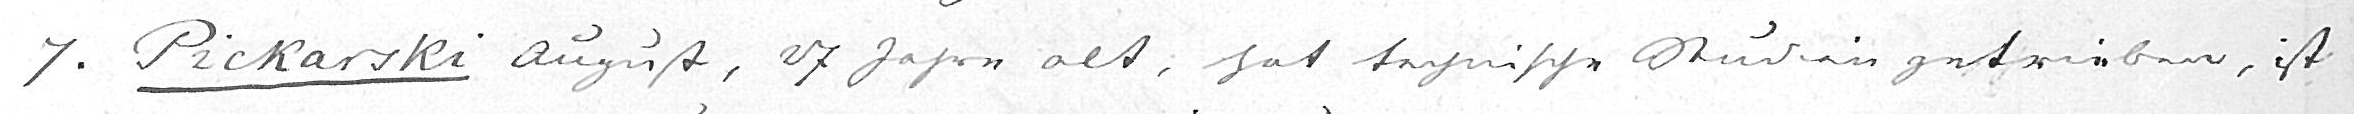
7. Pickarski August, 27 Jahre alt, hat technische Studien getrieben, ist
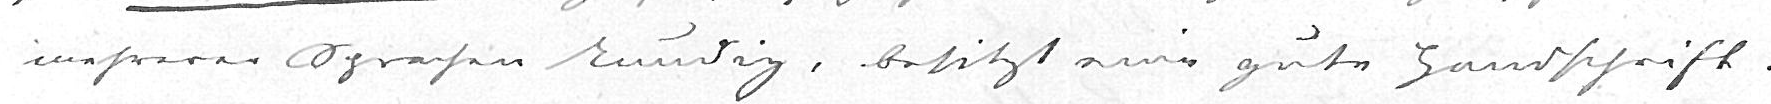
mehrerer Sprachen kundig, besitzt eine gute Handschrift.
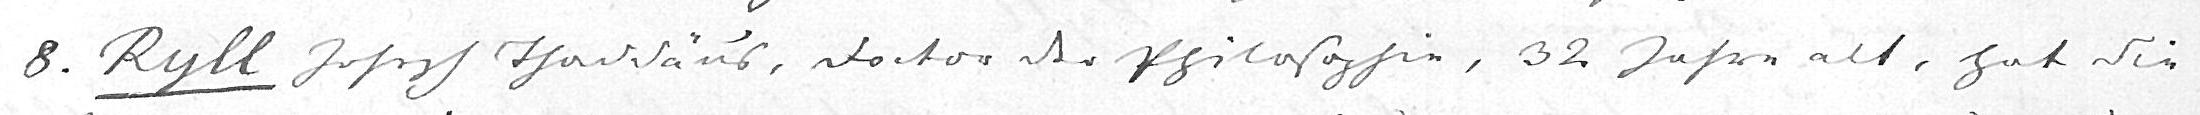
Ryll Joseph Thaddäus, Doctor der Philosophie, 32 Jahre alt, hat die
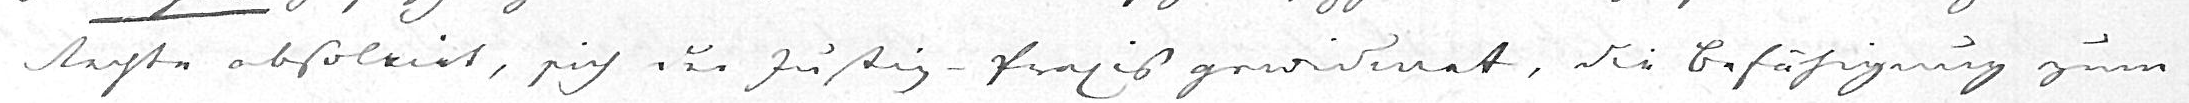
Rechte absolvirt, sich der Justiz Praxis gewidmet, die Befähigung zum
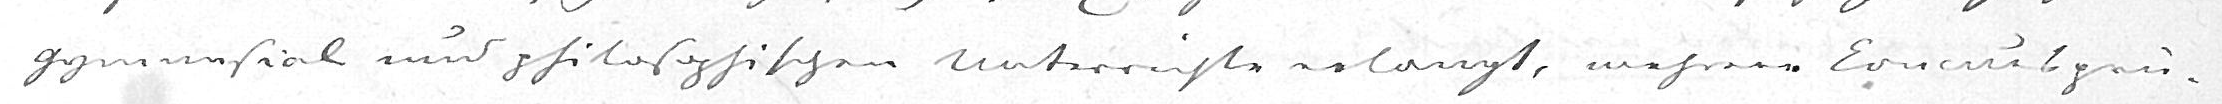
Gymnasial und philosophischen Unterrichte erlangt, mehrere Concursprü-
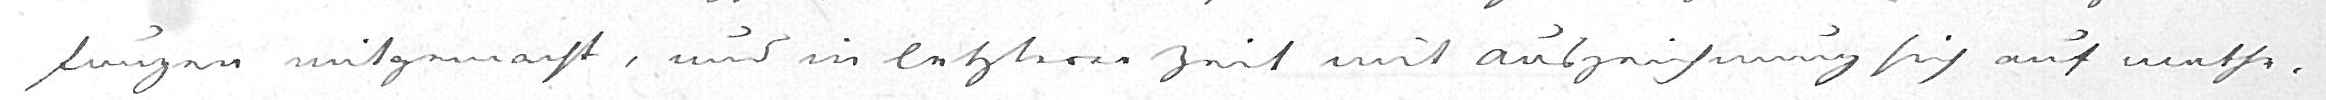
fungen mitgemacht, und in letzterer Zeit mit Auszeichnung sich auf mathe-
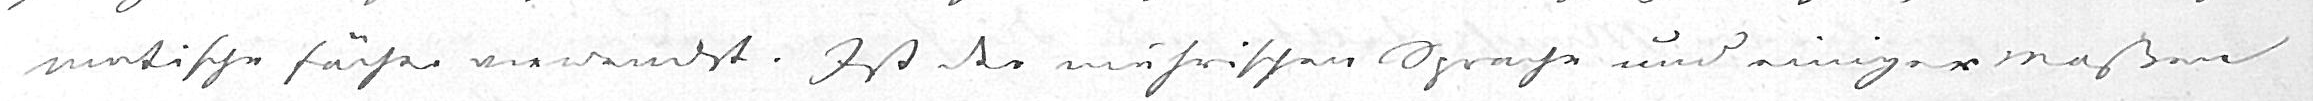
matische Fächer verwendet. Ist der mährischen Sprache und einigermaßen
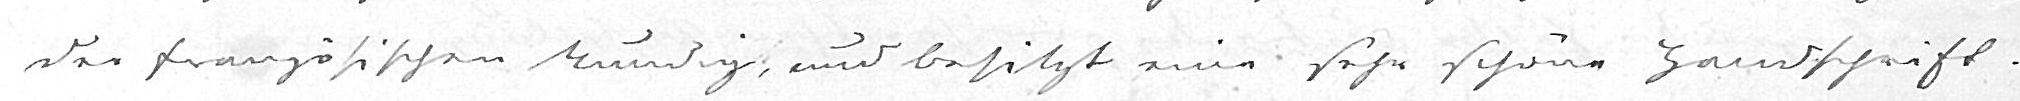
der französischen kundig, und besitzt eine sehr schöne Handschrift.
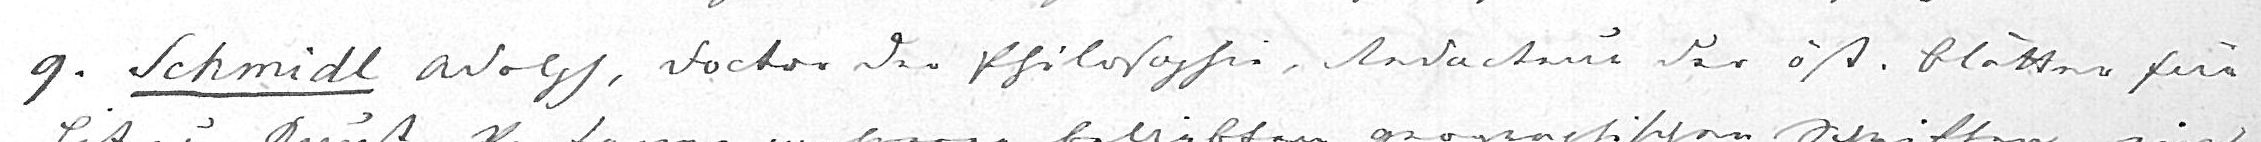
Schmidl, Adolph, Doctor der Philosophie, Redacteur der öst. Blätter für
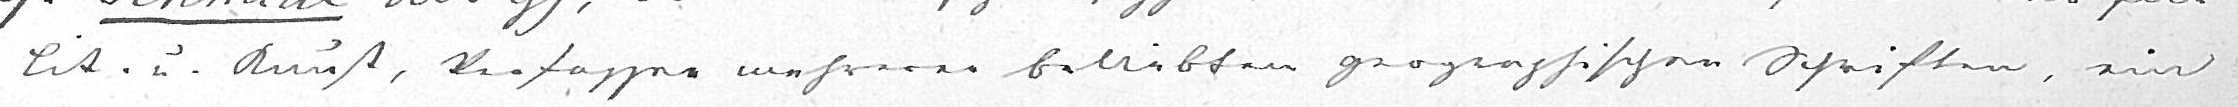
Lit. u. Kunst, Verfasser mehrerer Beliebten geographischen Schriften, ein
